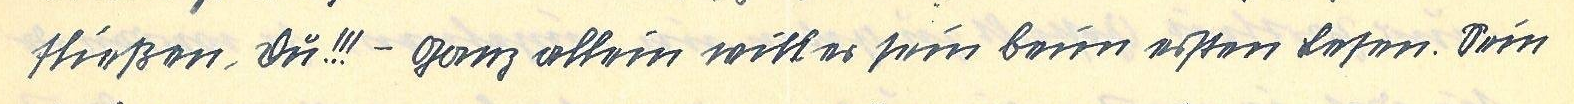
schießen, Du!!! – Ganz allein will er sein beim ersten Lesen. Sein
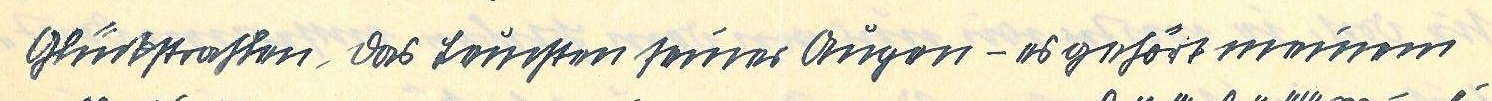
Glücksstrahlen, das Leuchten seiner Augen – es gehört meinem
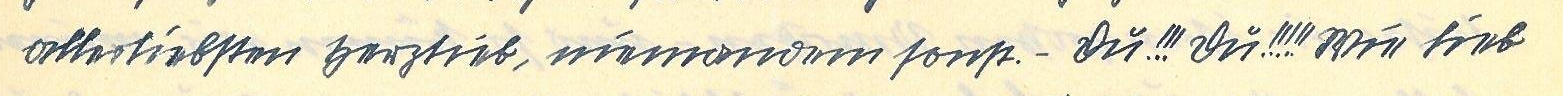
allerliebsten Herzlieb, niemanden sonst. – Du!!! Du!!!!! Wie lieb
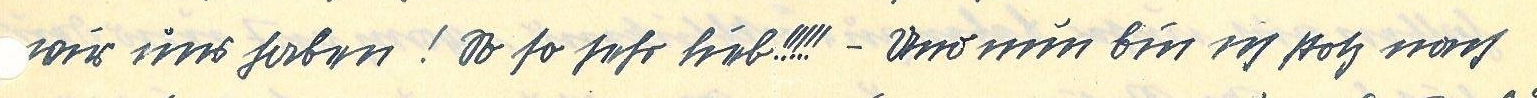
wir uns haben! So so sehr lieb!!!!! – Und nun bin ich stolz nach,
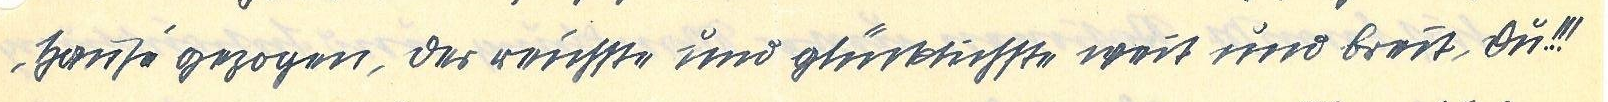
Hause’ gezogen, der reichste und glücklichste weit und breit, Du!!!
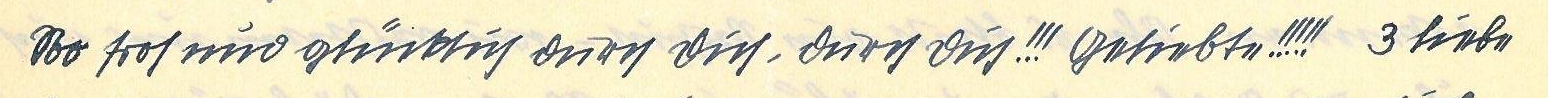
Soo froh und glücklich durch Dich, durch Dich!!! Geliebte!!!!! 3 liebe
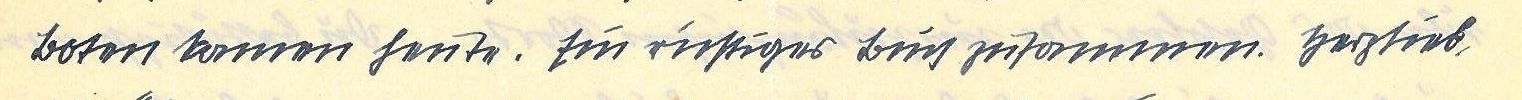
Boten kamen heute. Ein richtiges Buch zusammen. Herzlieb,
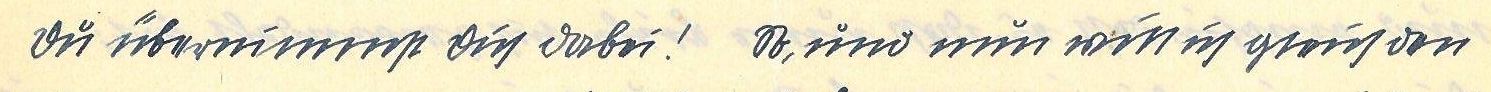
Du übernimmst Dich dabei! So, und nun will ich gleich den
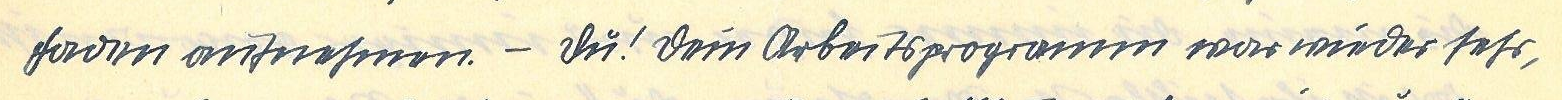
Faden aufnehmen. – Du! Dein Arbeitsprogramm war wieder sehr,
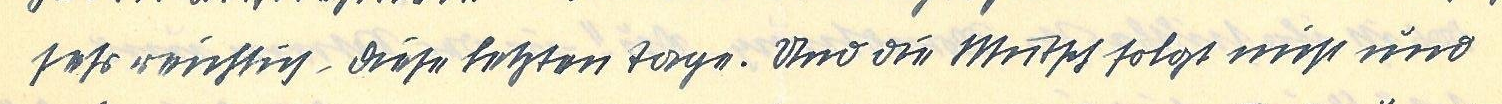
sehr reichlich, diese letzten Tage. Und die Mutsch folgt nicht und
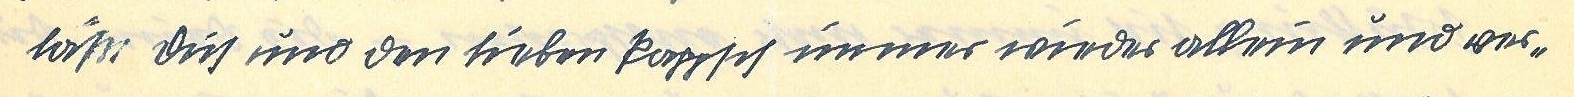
läßt Dich und den lieben Pappsch immer wieder allein und ver¬
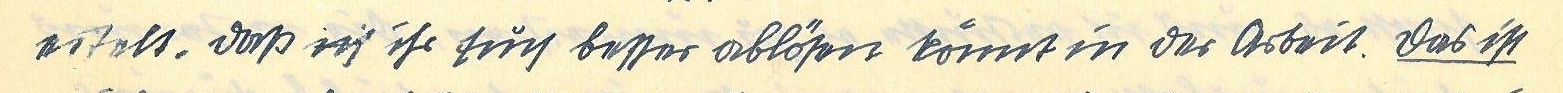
eitelt, daß ich ihr Euch besser ablösen könnt in der Arbeit. Das ist
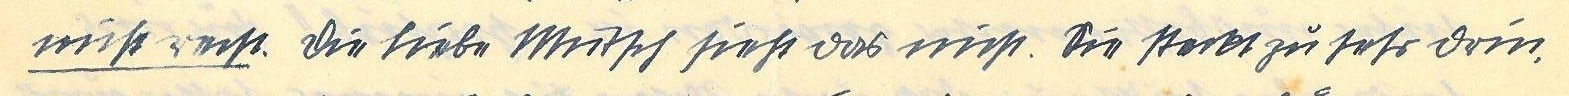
nicht recht. Die liebe Mutsch sieht das nicht. Sie steckt zu sehr drin.
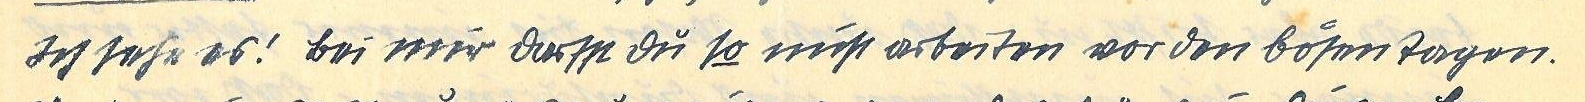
Ich sehe es! Bei mir darfst Du so nicht arbeiten vor den bösen Tagen.
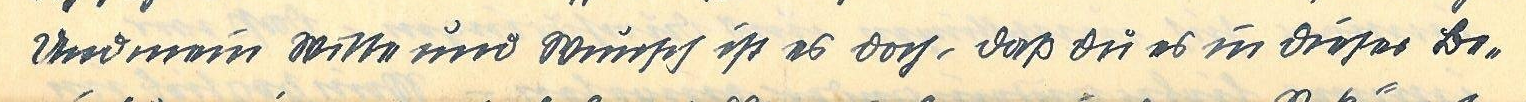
Und mein Wille und Wunsch ist es doch, daß Du es in dieser Be¬
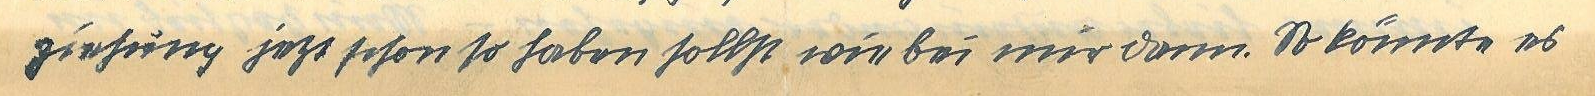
ziehung jetzt schon so haben sollst wie bei mir dann. So könnte es
